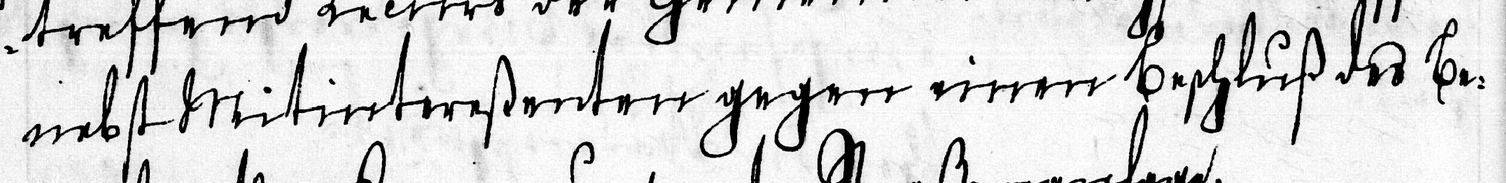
nebst Mitintereßenten gegen einen Beschluß des Be¬
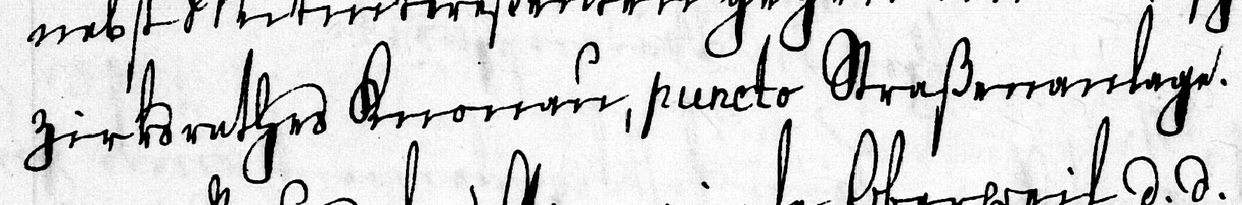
zirksrathes Knonau, puncto Straßenanlage.
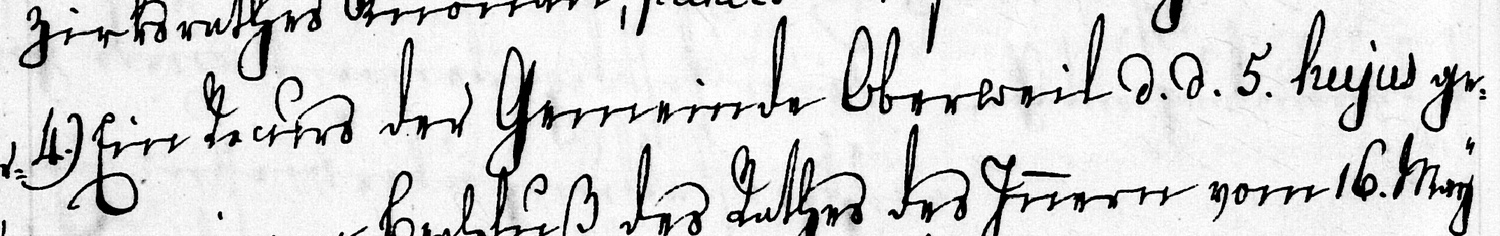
4.) Ein Recurs der Gemeinde Oberweil d. d. 5. hujus ge¬
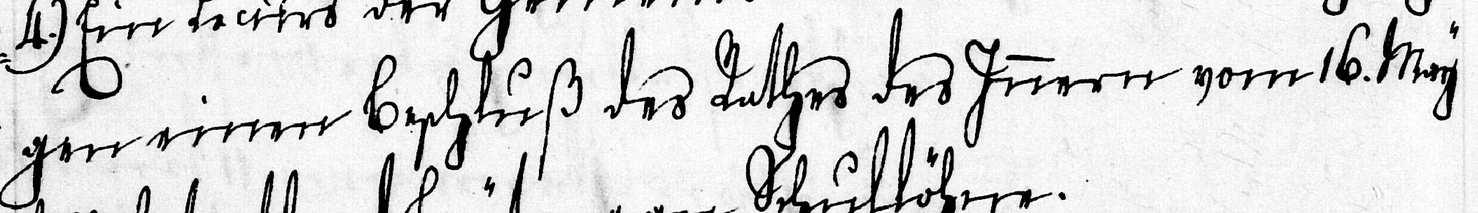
gen einen Beschluß des Rathes des Innern vom 16. May
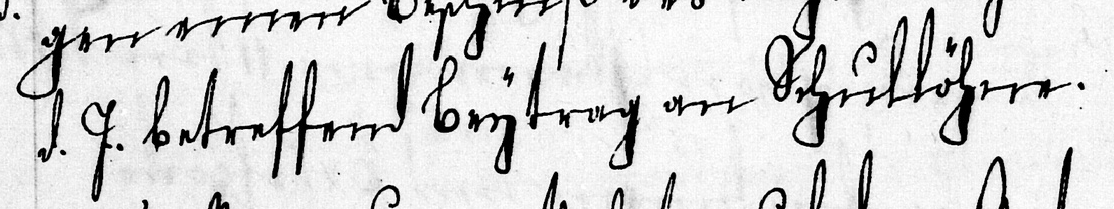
d. J. betreffend Beytrag an Schullöhne.
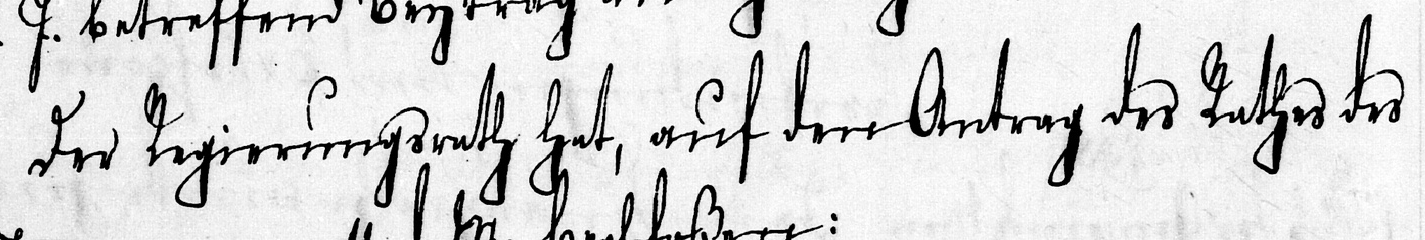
Der Regierungsrath hat, auf den Antrag des Rathes des
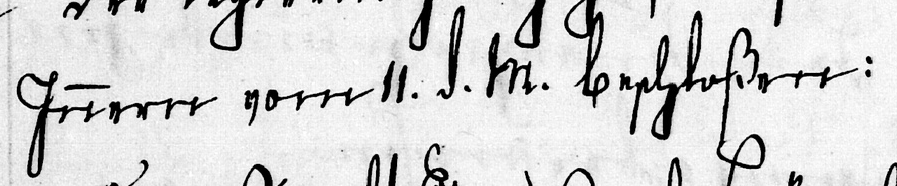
Innern vom 11. d. M. beschloßen:
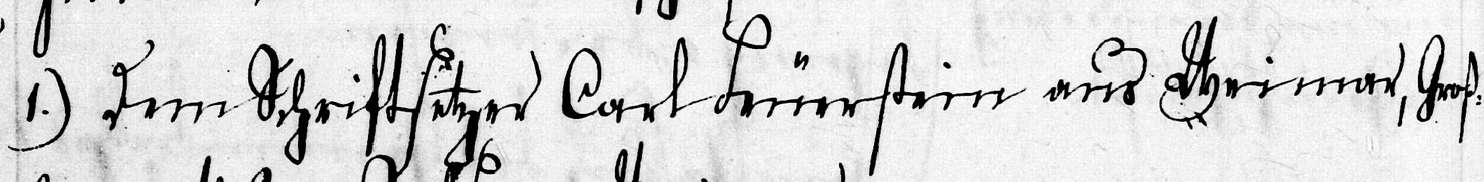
1.) Dem Schriftsetzer Carl Feuerstein aus Weimar, Gro¬
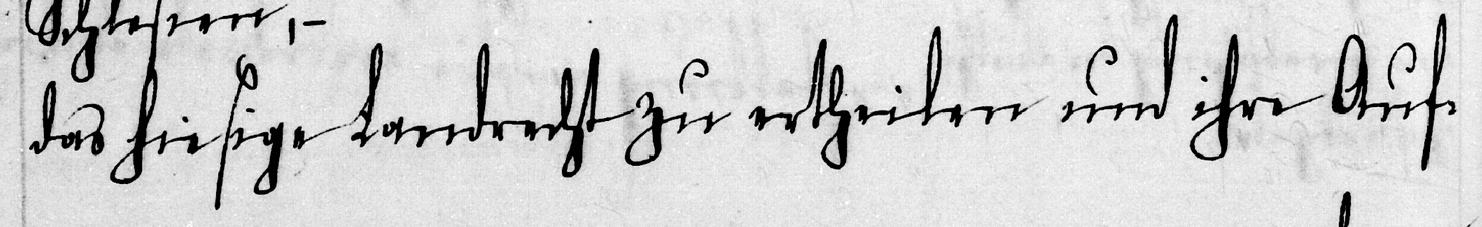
das hiesige Landrecht zu ertheilen und ihre Auf-
